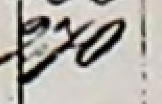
270
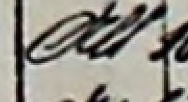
Alt
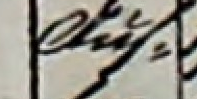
Auf„
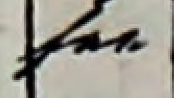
see
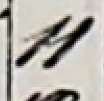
11
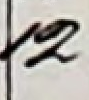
12
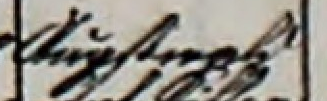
Augstwald
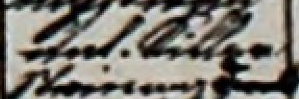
unt. Killer
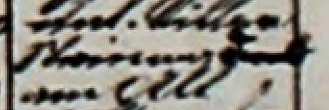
Stein???
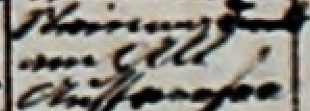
am ???
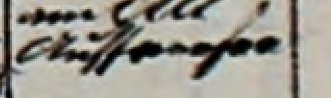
Aussnersee
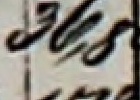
36,8
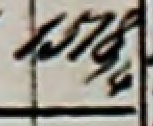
1578,4
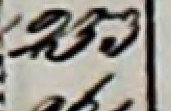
253
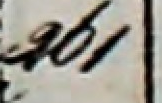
261
